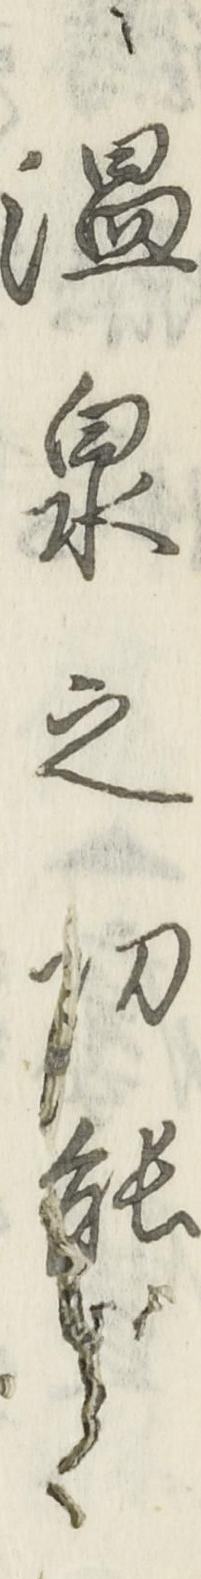温泉之功能
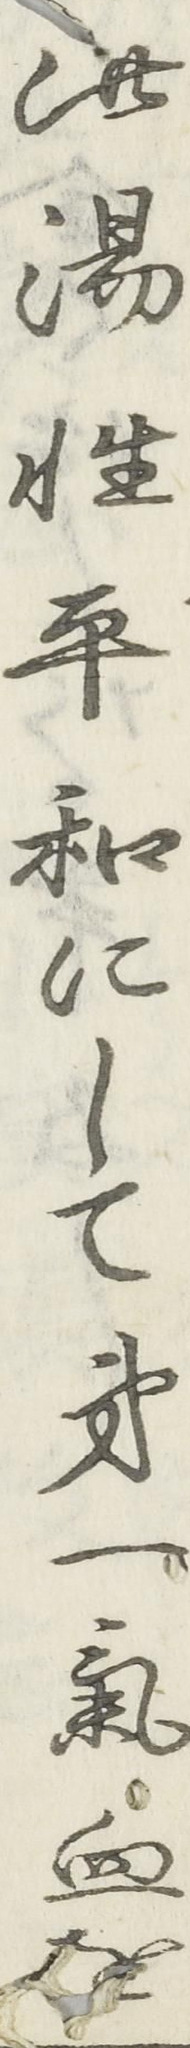此湯性平和にして第一気血を
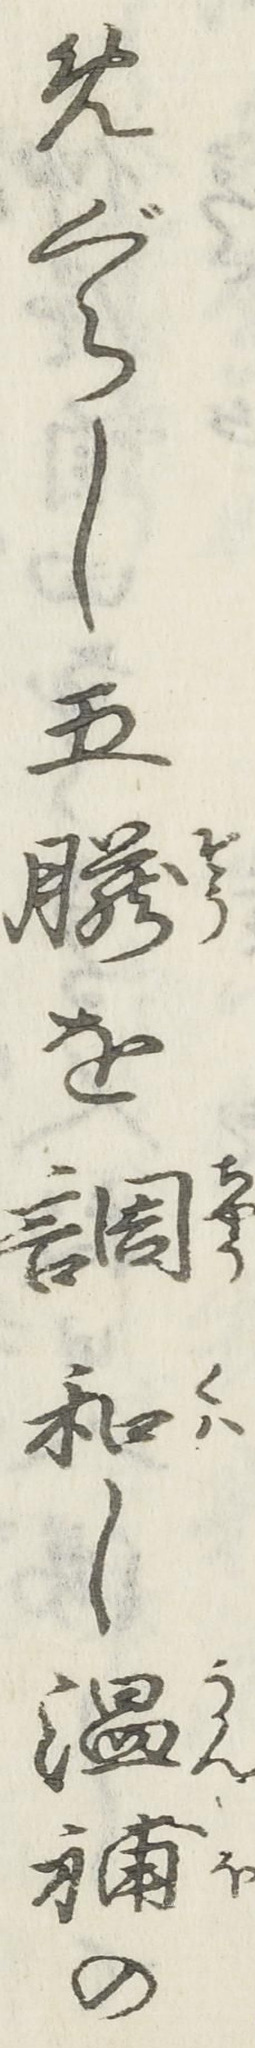めぐらし五臓を調和し温補の
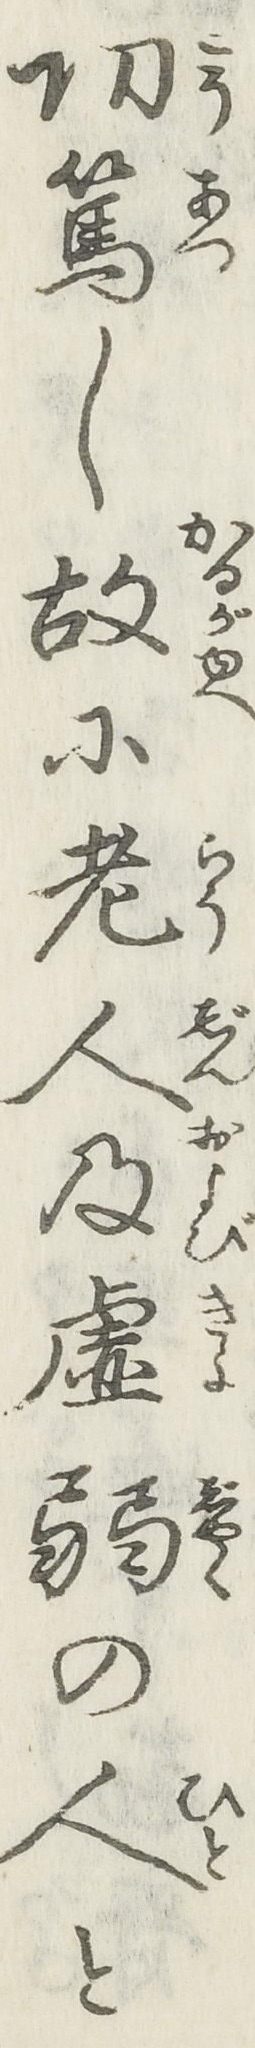功篤し故に老人及虚弱の人と
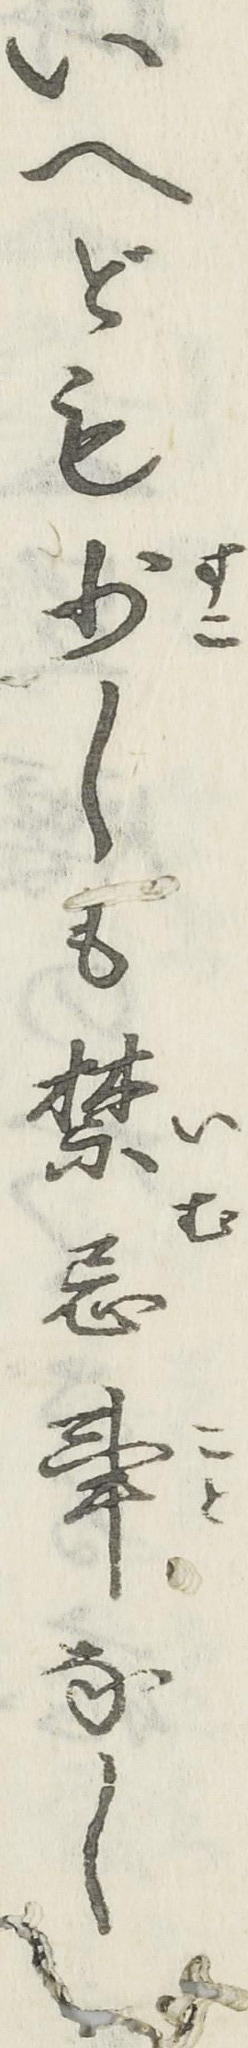いへども少しも禁忌事なし
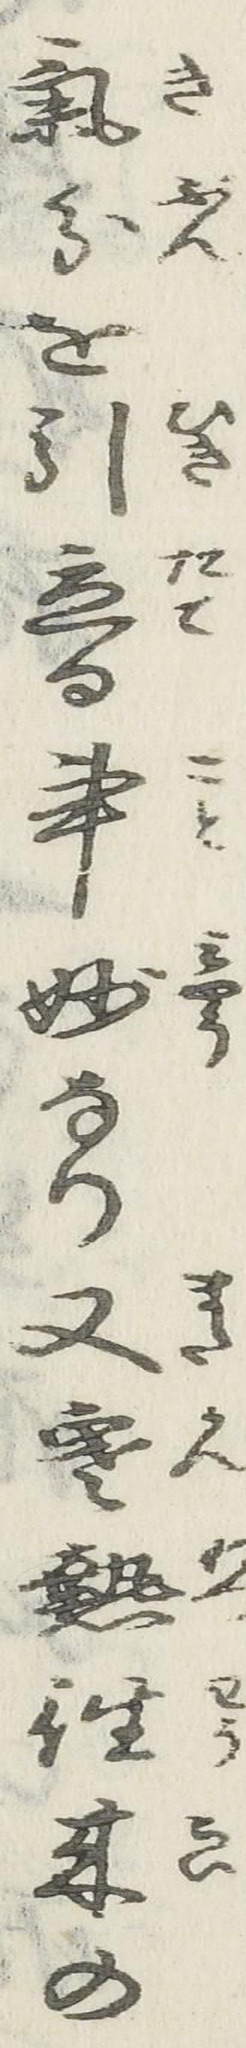気分を引立る事妙なり又寒熱往来の
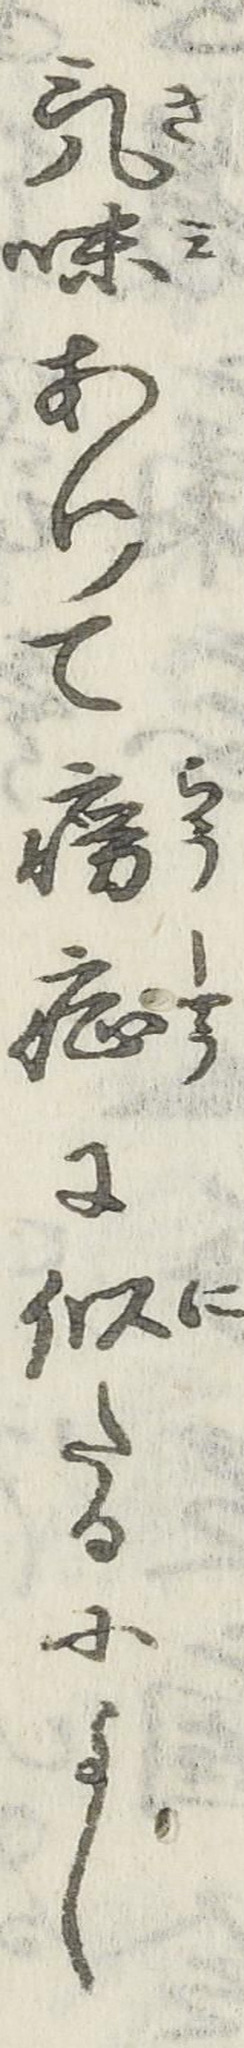気味ありて癆症に似にたるによし

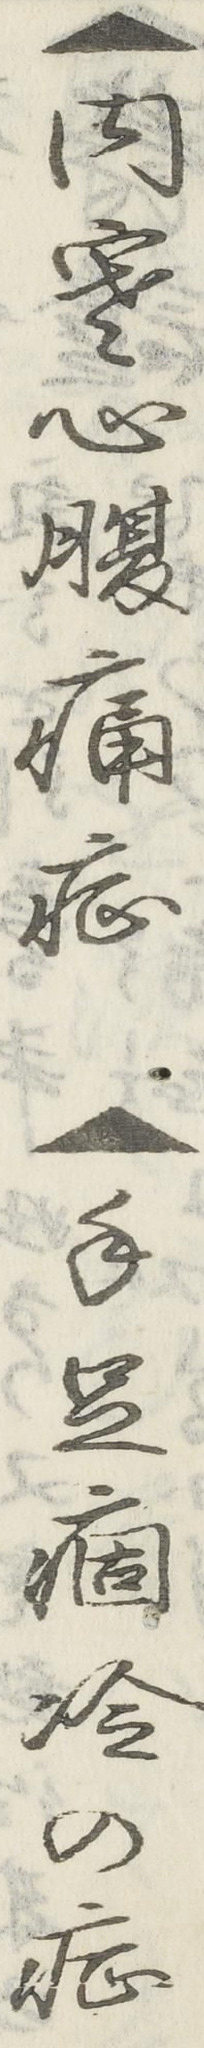▲内寒心腹痛症▲手足痼冷の症
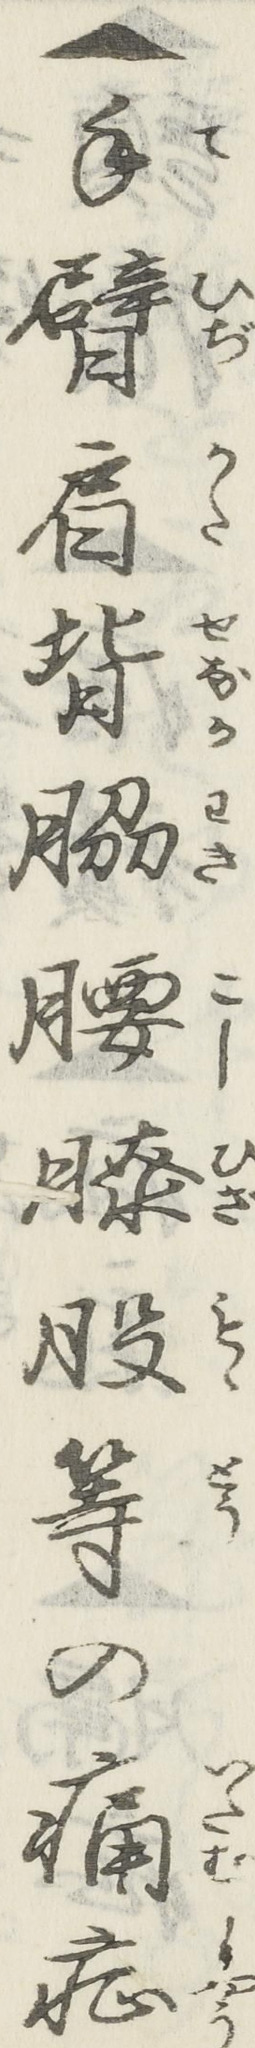▲手臂肩背脇腰膝股等の痛症
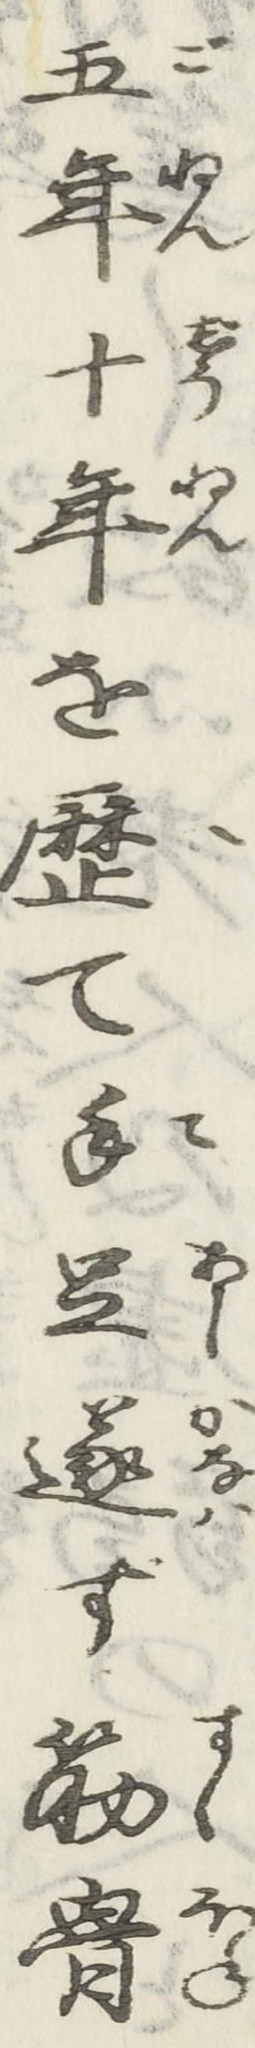五年十年を歴て手足遂ず筋骨
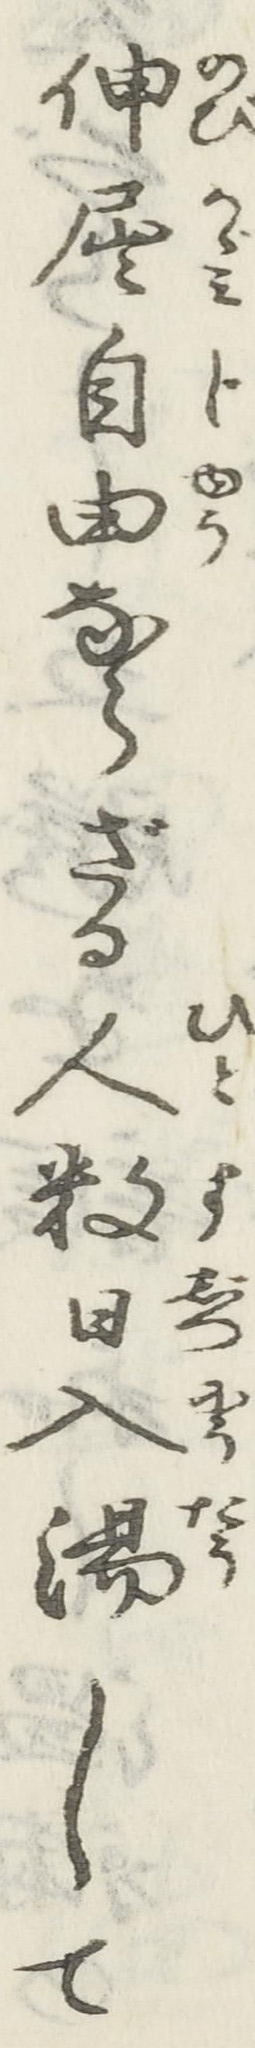伸屈自由ならざる人数日入湯して
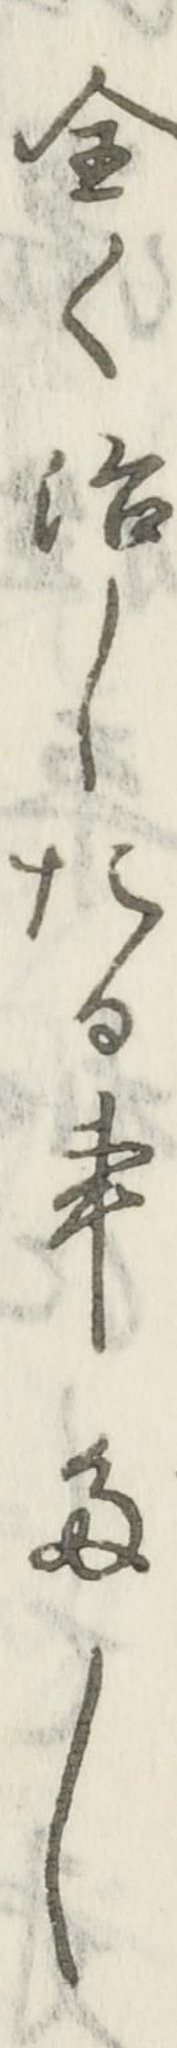全く治したる事多し
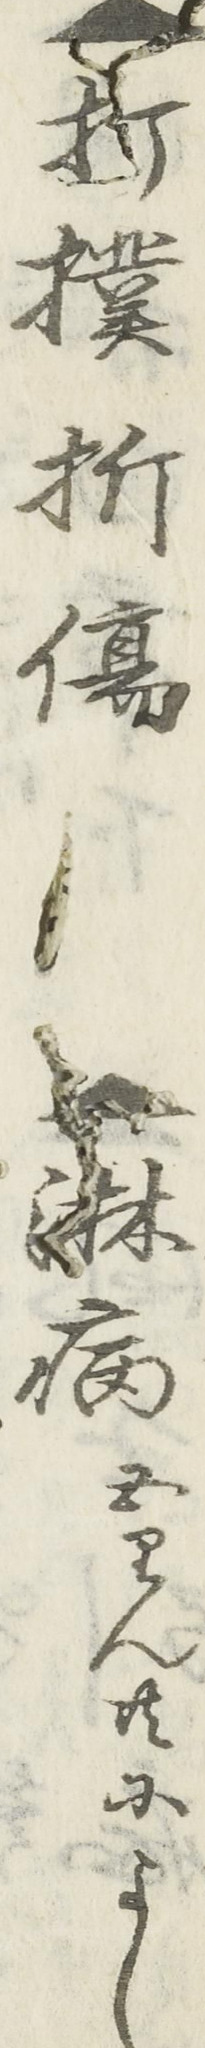▲打撲折傷▲淋病五りん共によし

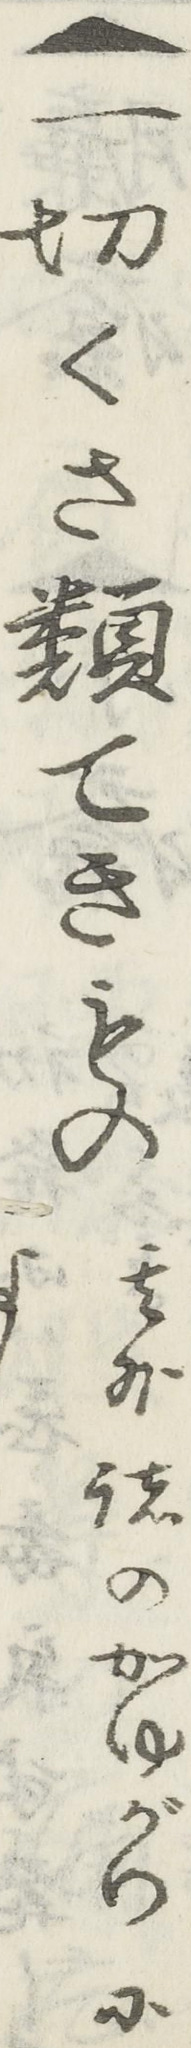▲一切くさ類てきもの其外諸のかゆがりによし
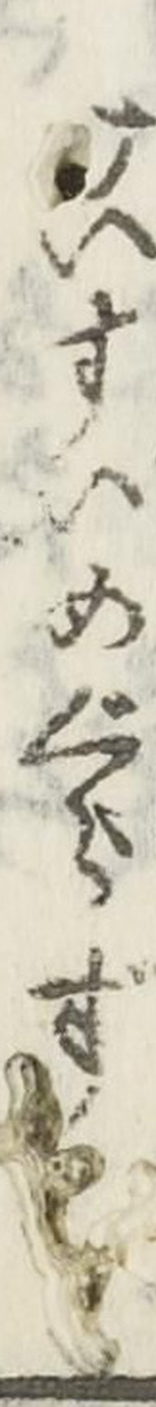けいすいめぐらず
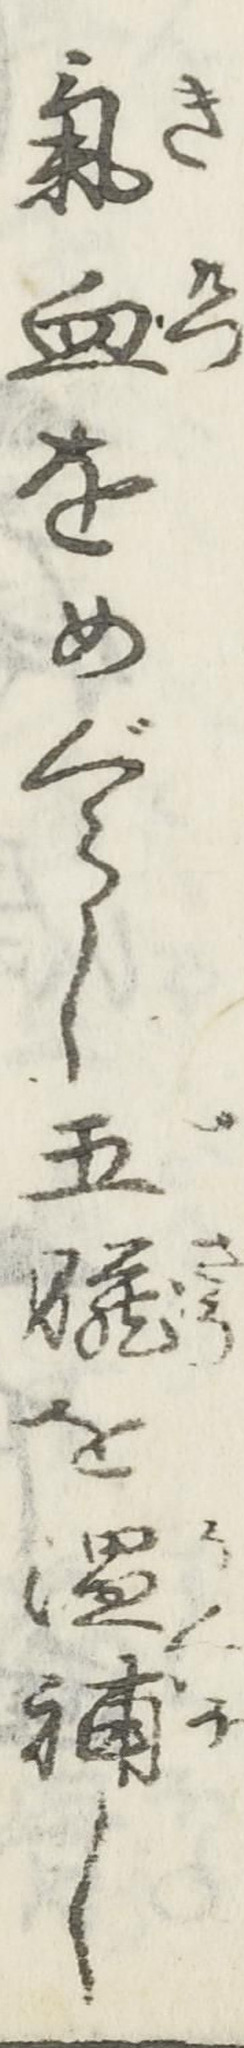気血をめぐらし五臓を温補し
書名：温泉来由記
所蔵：東京大学地震研究所図書室 Earthquake Research Institute Library, The University of Tokyo, JAPAN
